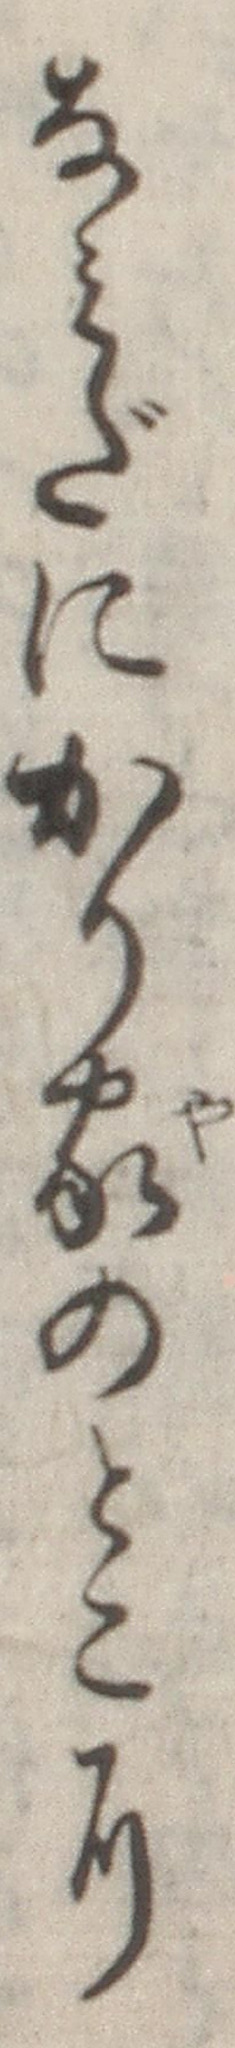なみだにかり家のとこに
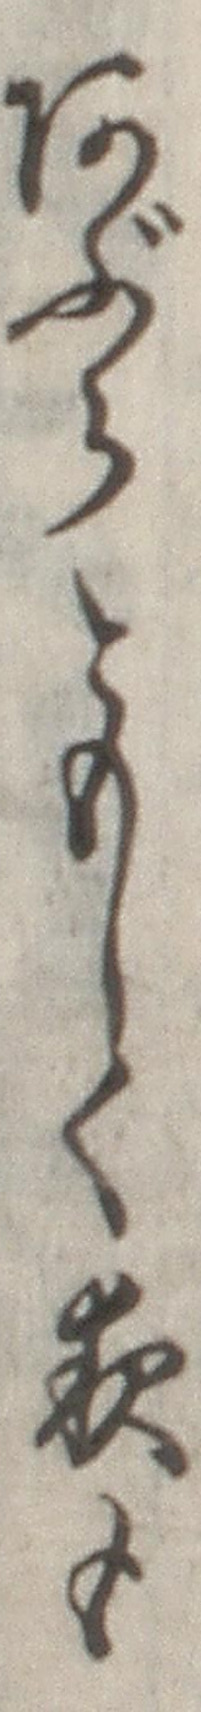あぶらともして夜も
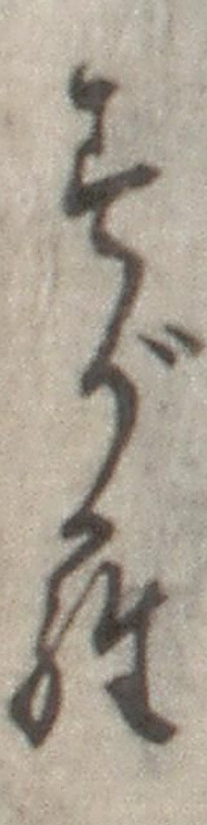すがら

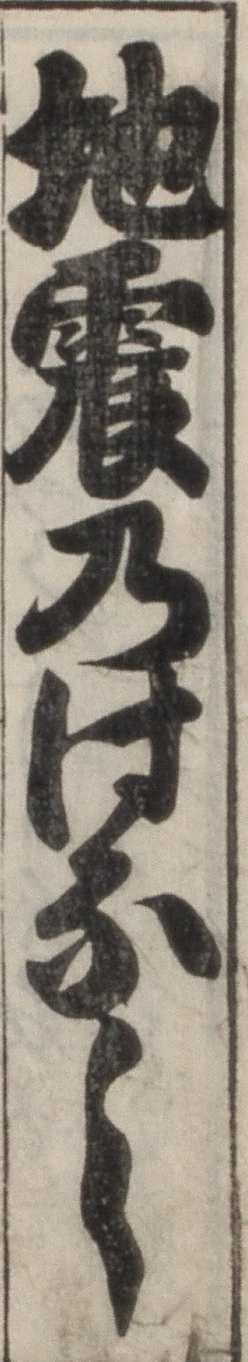地震のはなし
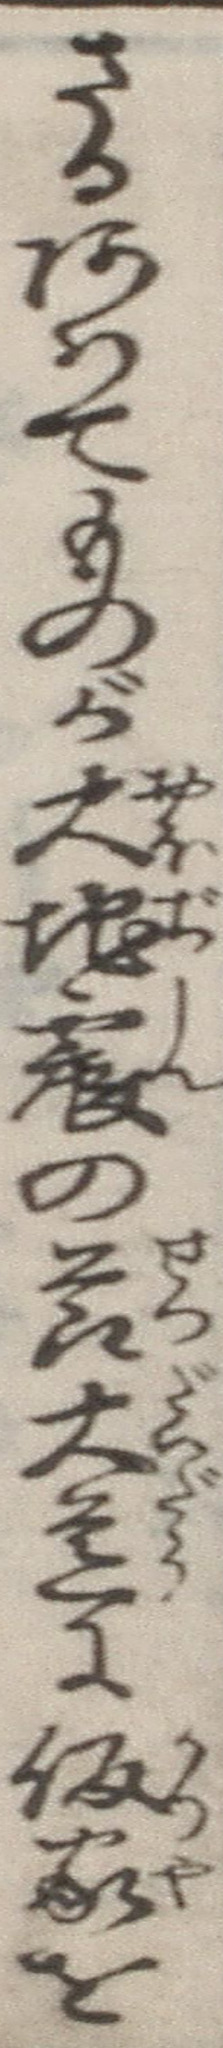さるあはてものが大地震の節大道に仮家を
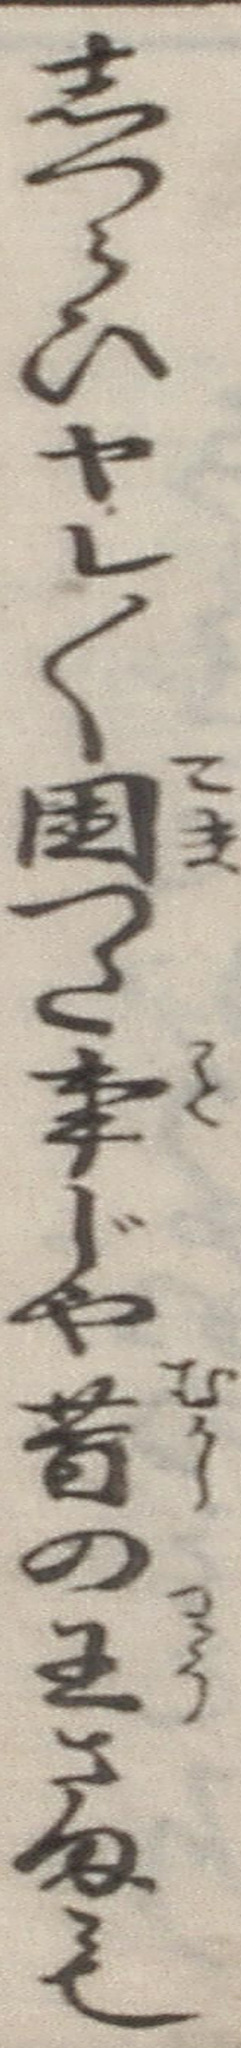しつらひヤレ〳〵困つた事じや昔の王さまも
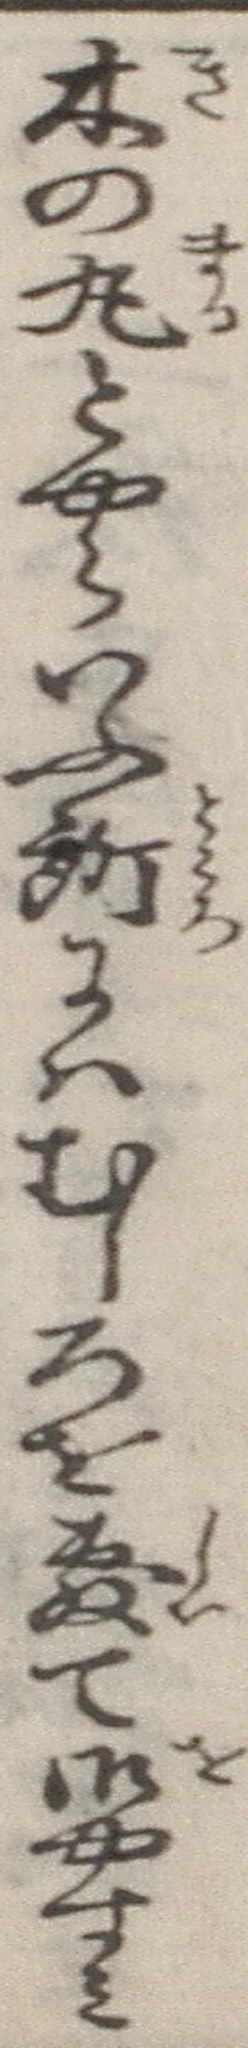木の丸とやらいふ所にはむしろを敷て御やすみ
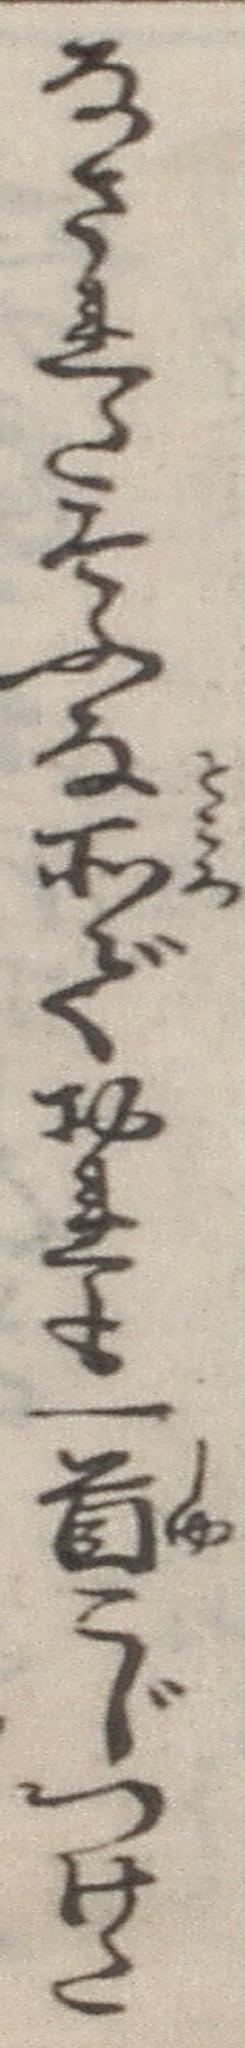なされたそふな所でおれも一首こじつけた
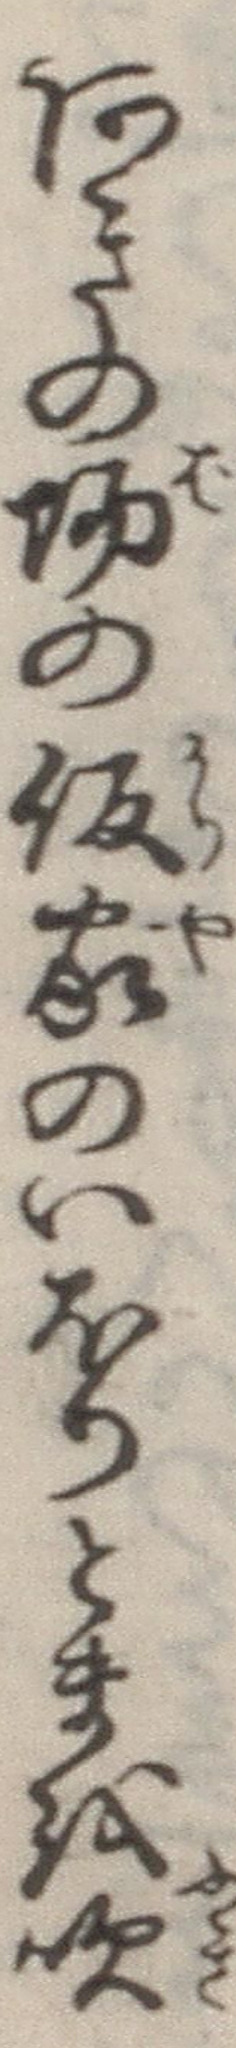あきの場の仮家のいほりとまを吹
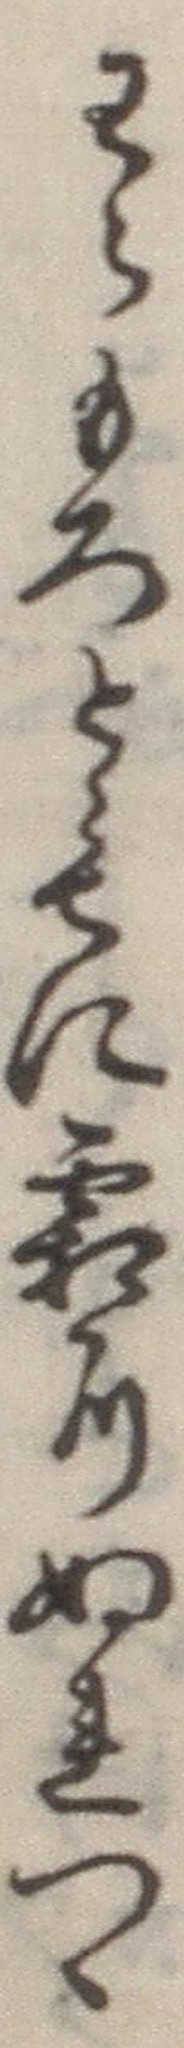わらもろともに霜にぬれつゝ
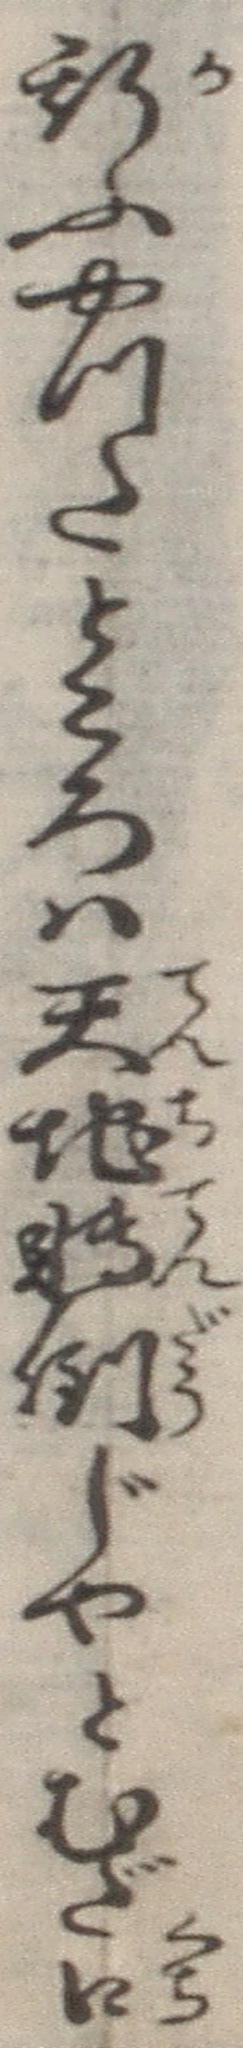斯ふやつたところは天地轉倒じやとむだ口
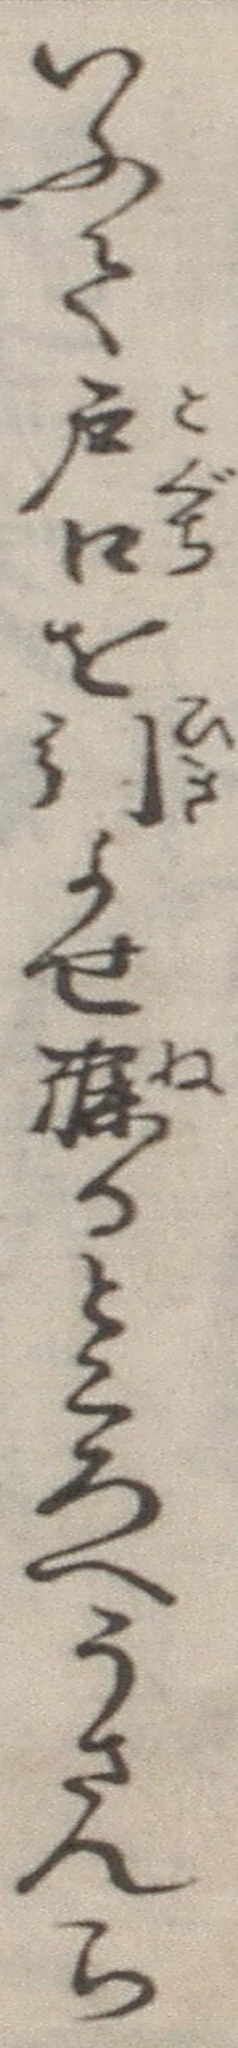いふて戸口を引よせ寝るところへうさんら
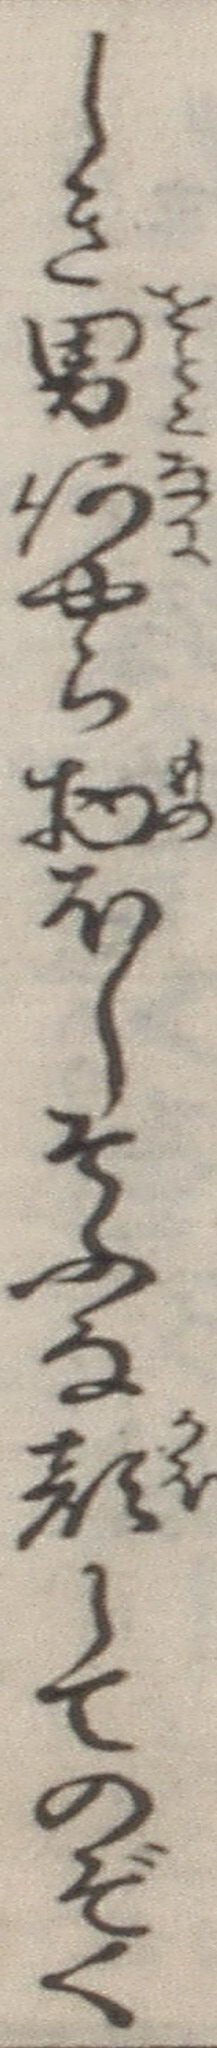しき男何やら物ほしそふな顔してのぞく
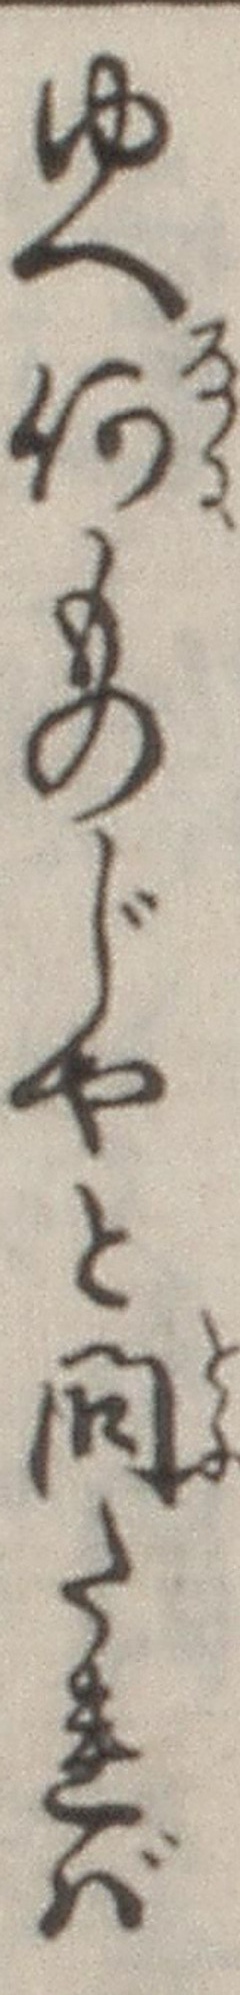ゆへ何ものじやと問たれば
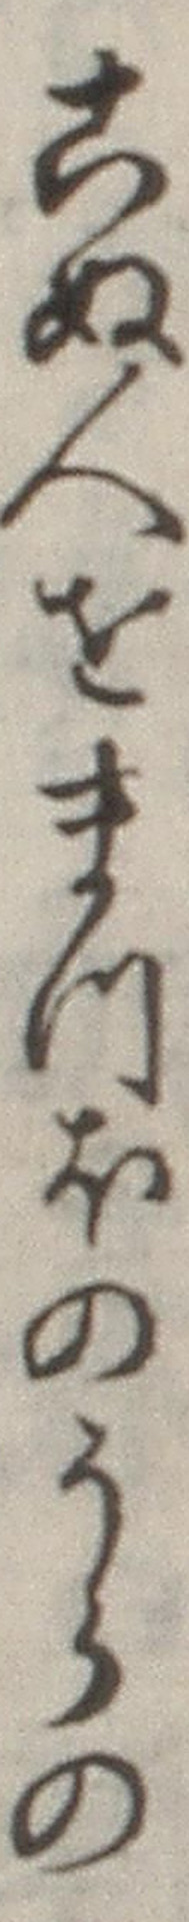こぬ人をまつほのうらの
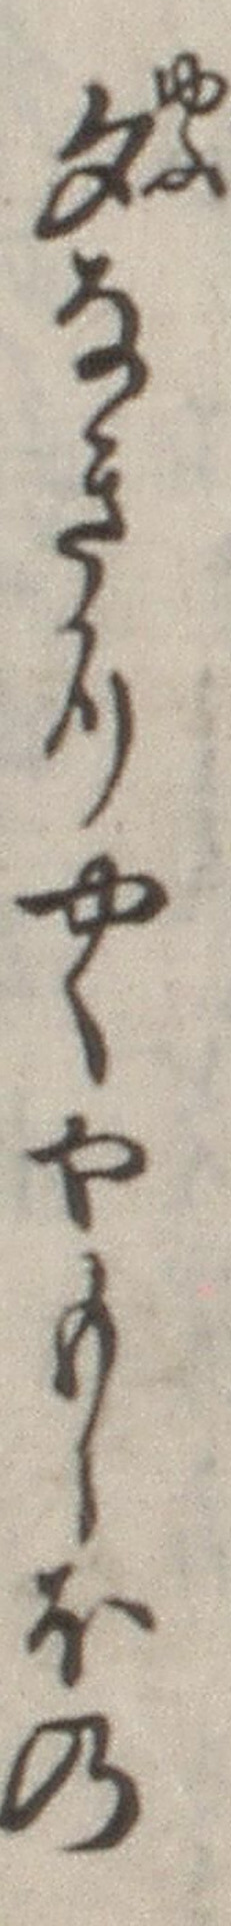夕なきにやくやもしほの
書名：諸國大地震年代記　末代噺種
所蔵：東京大学地震研究所図書室 Earthquake Research Institute Library, The University of Tokyo, JAPAN
